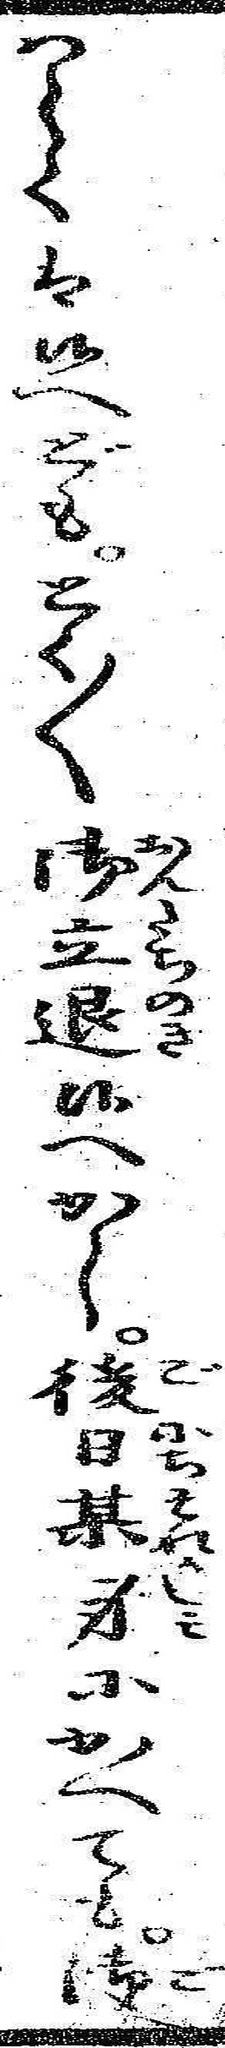はしくは候へども。とく〳〵御立退候へかし。後日某身にかへても。御
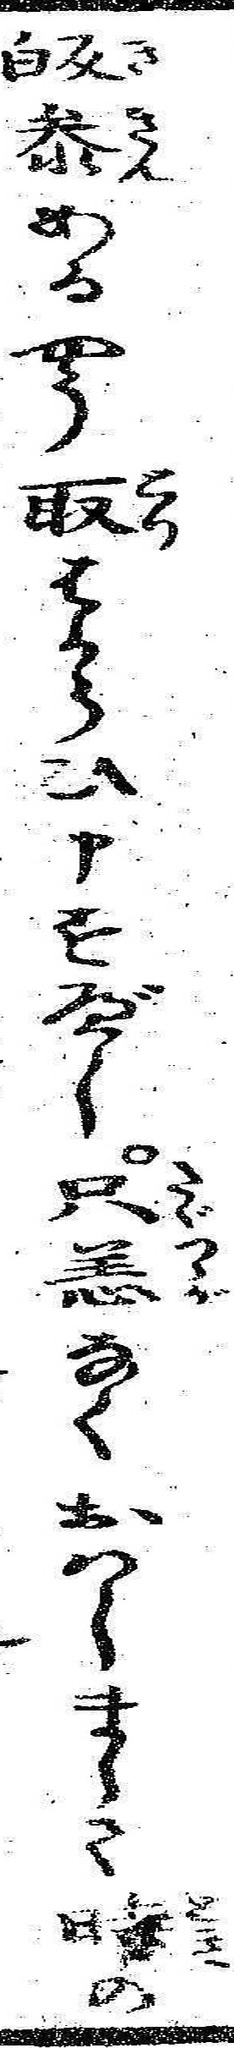帰参あるやう取はからひ申すべし。只恙なくおはしまして時の
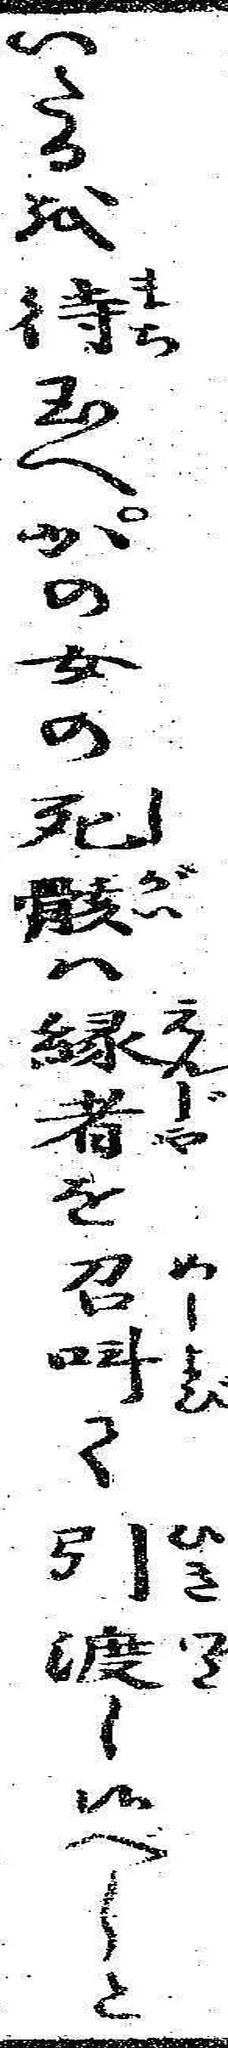いたるを待玉へ。かの女の死骸は縁者を召叫て引渡し候べしと
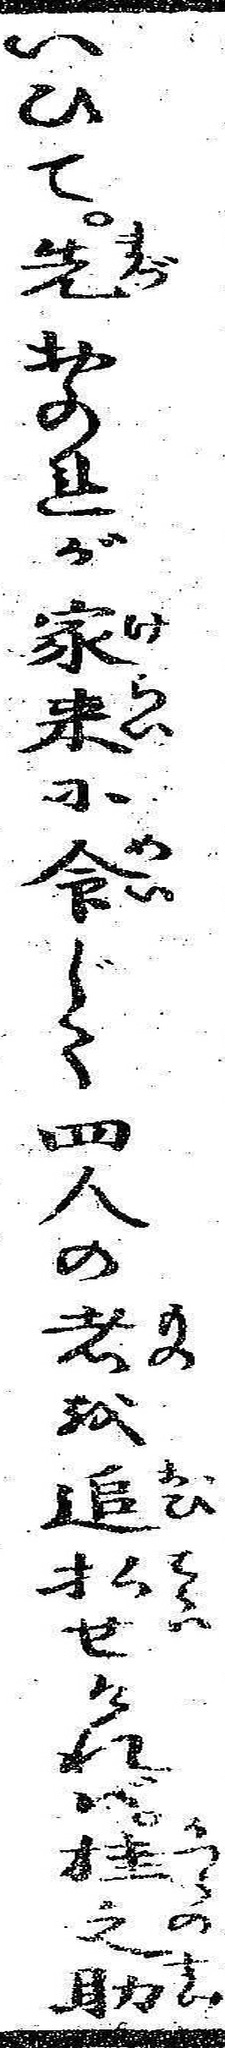いひて。先おのれが家来に命じて四人の者を追払せければ。桂之助
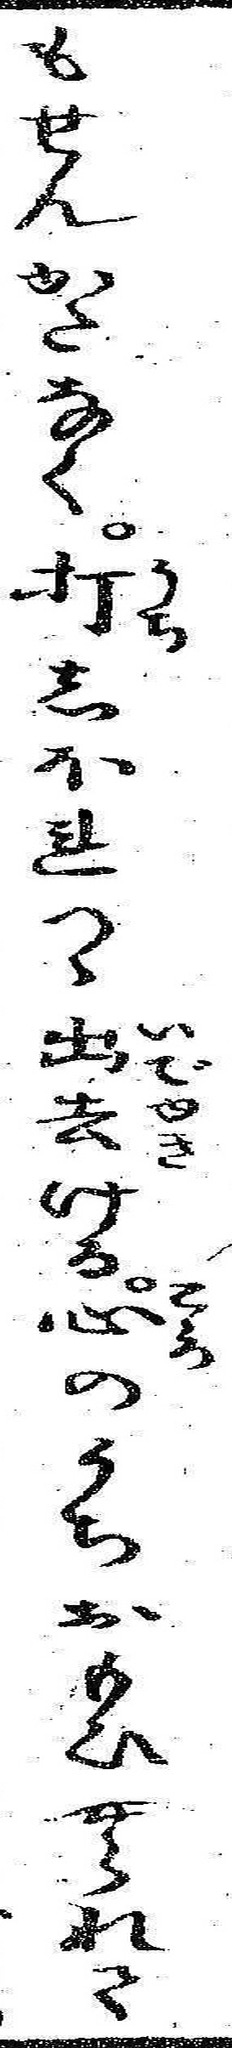もせんかたなく。打しほれつゝ出去ける。心のうちおもひやられて
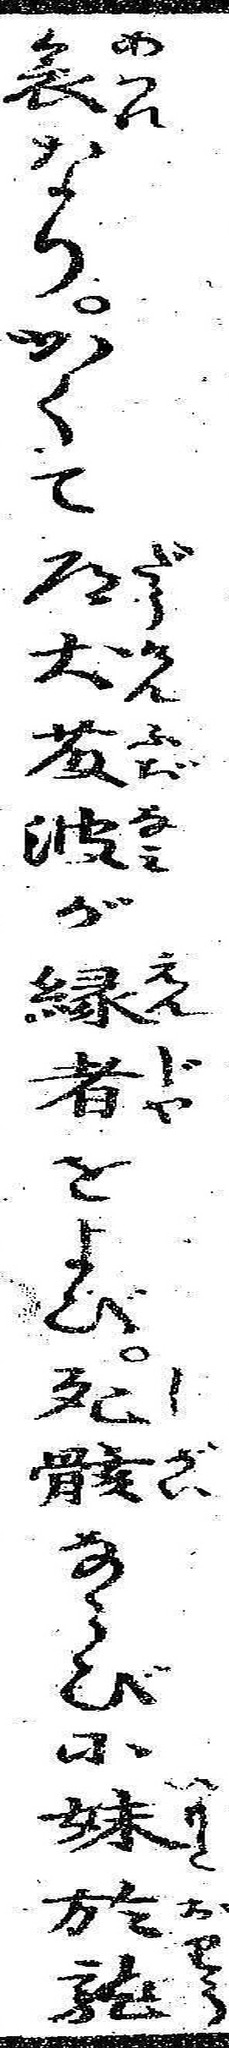哀なり。かくて道犬藤波が縁者をよび。死骸ならびに妹於竜
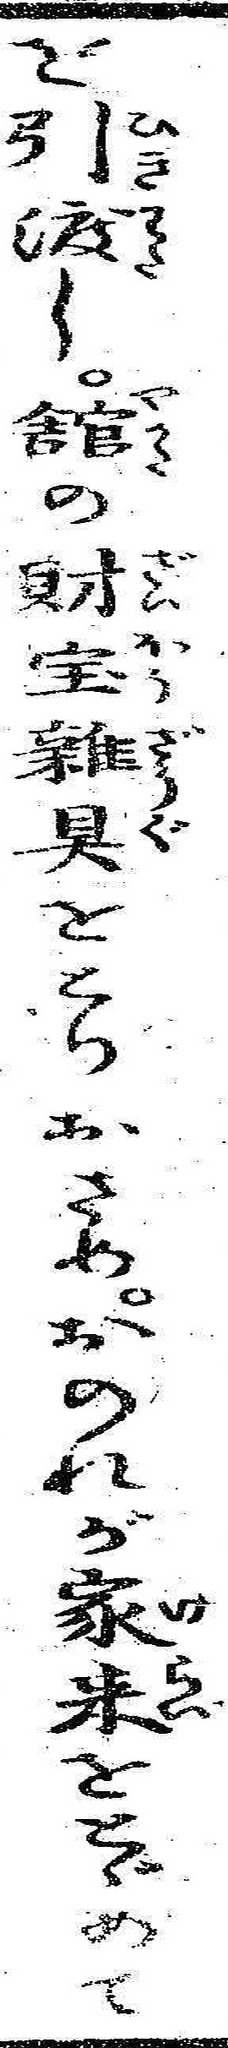を引渡し。館の財宝雑具をとりおさめ。おのれが家来をとゞめて
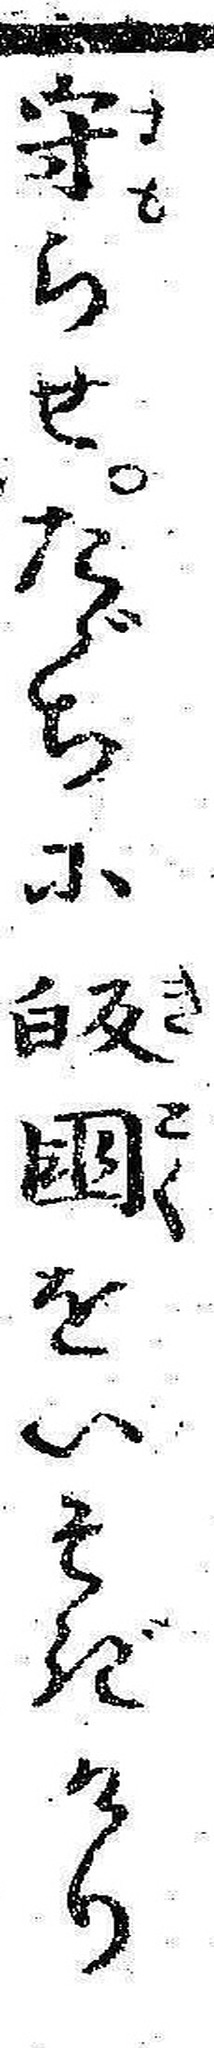守らせ。たゞちに帰国をいそぎけり
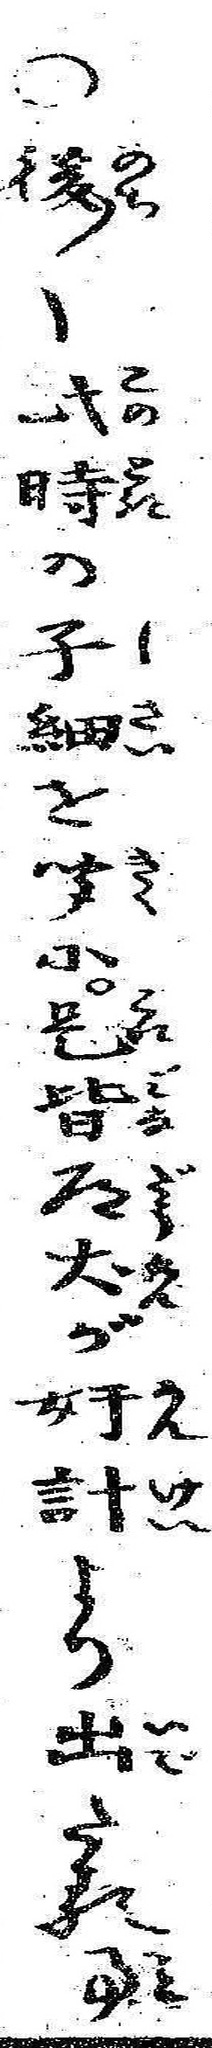○後〳〵此時の子細を聞に。是皆道犬が奸計より出たる事
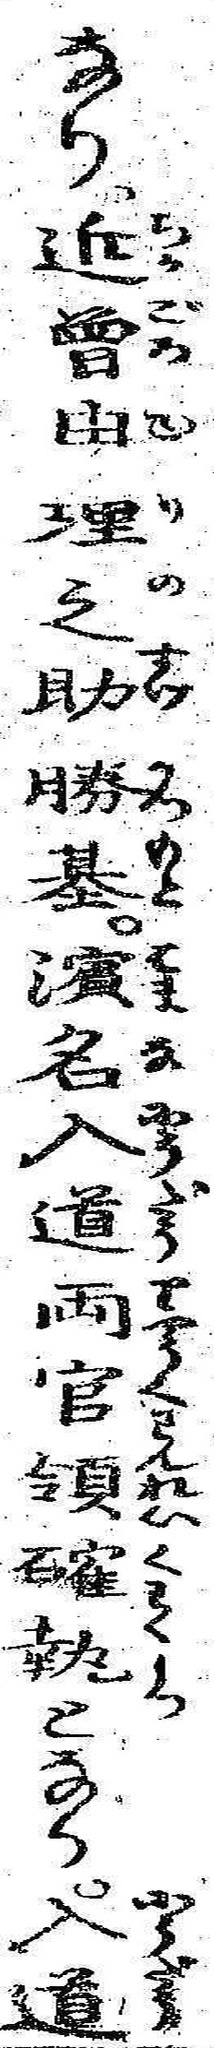なり。近曽由理之助勝基。浜名入道両官領確執となり。入道
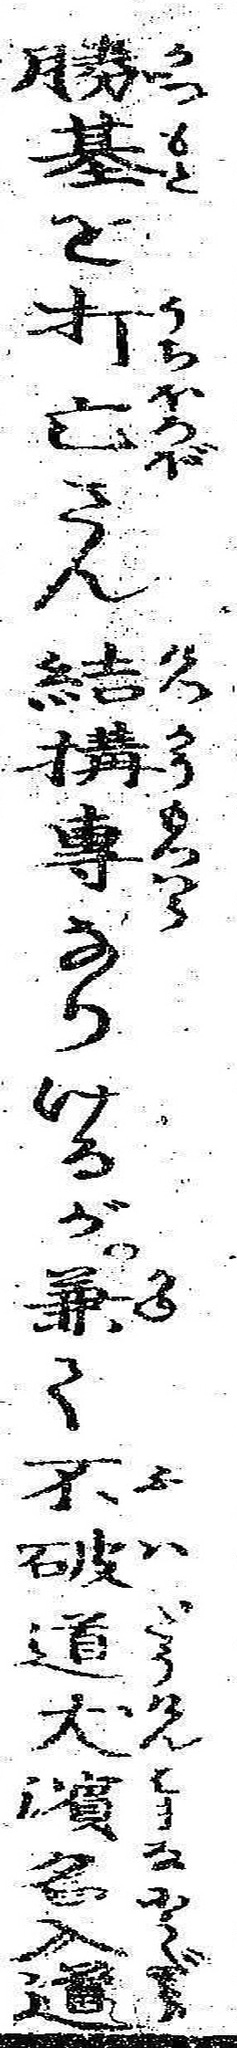勝基を打亡さん結構専なりけるが。兼て不破道犬浜名入道
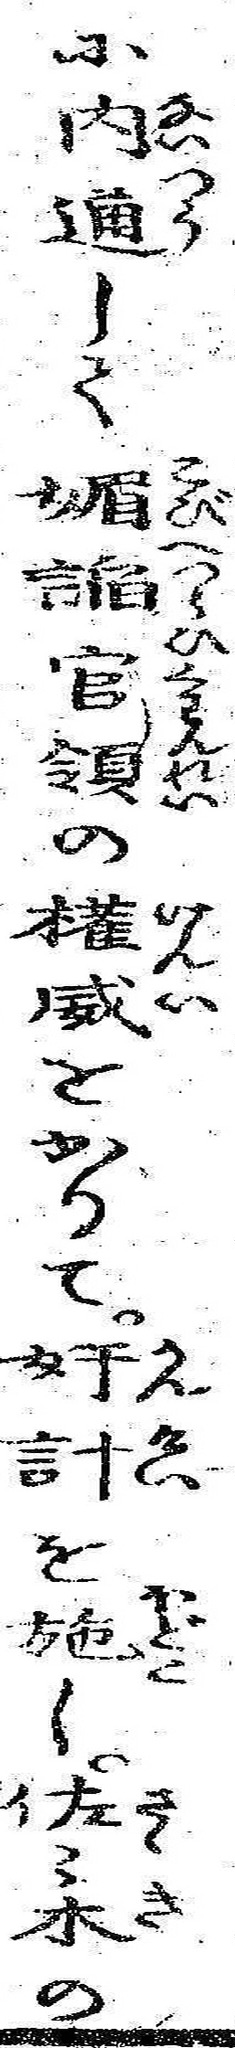に内通して媚諂官領の権威をかりて。奸計を施し。佐々木の
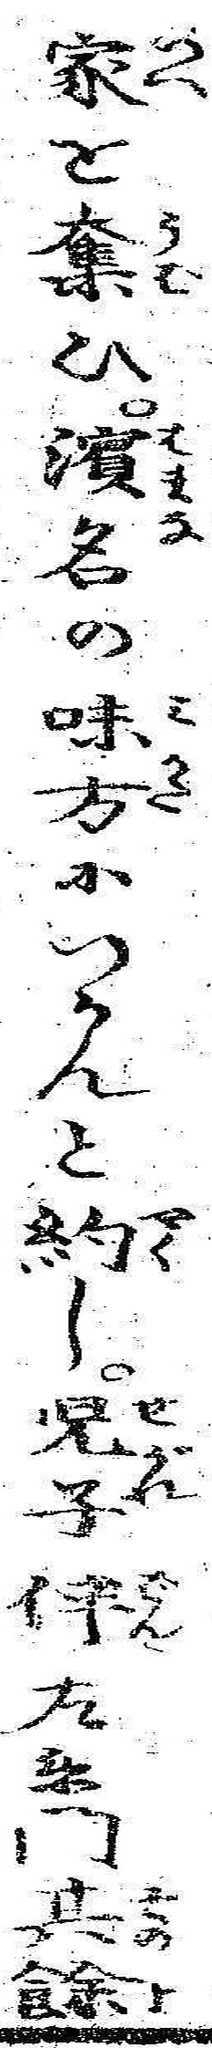家を奪ひ。浜名の味方につかんと約し。児子伴左衛門其余
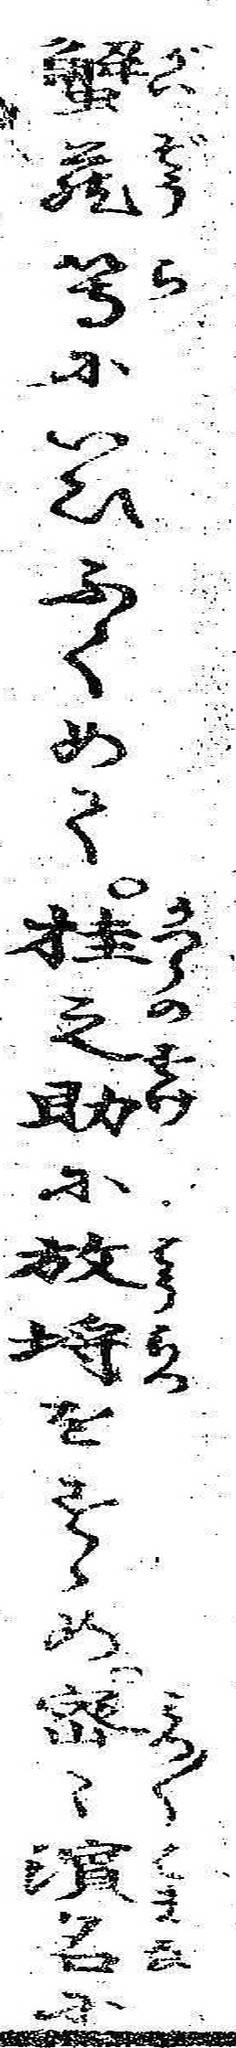蟹蔵等にいひふくめて。桂之助に放埒をすゝめ。密々浜名に
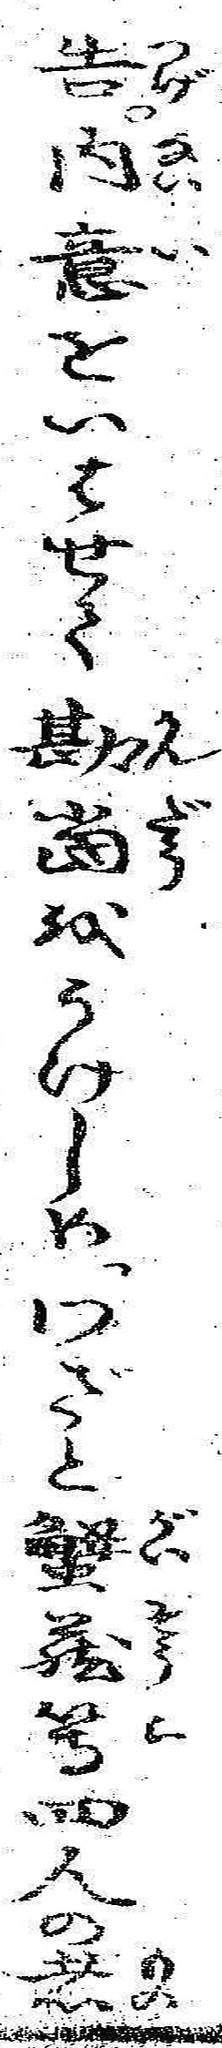告。内意をいはせて勘当をうけしめ。わざと蟹蔵等四人の者
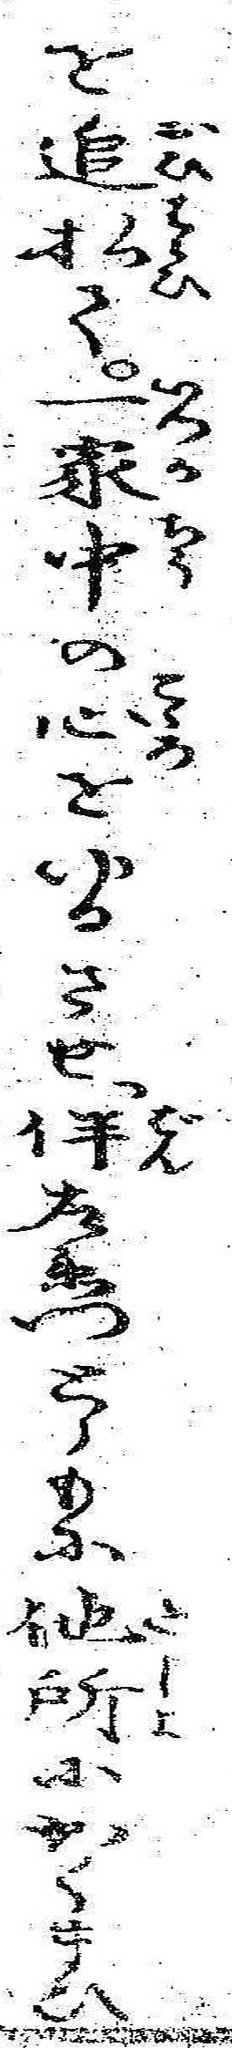を追払て。一家中の心をゆるさせ。伴左衛門とゝもに他所にかくまひ
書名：昔話稲妻表紙
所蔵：国文学研究資料館
